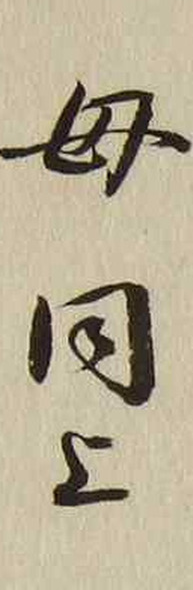母同上
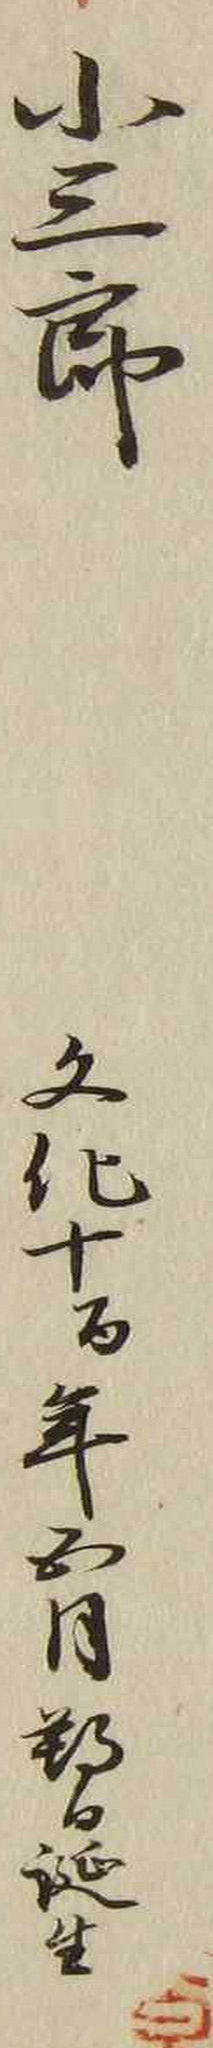小三郎文化十酉年五月朔日誕生

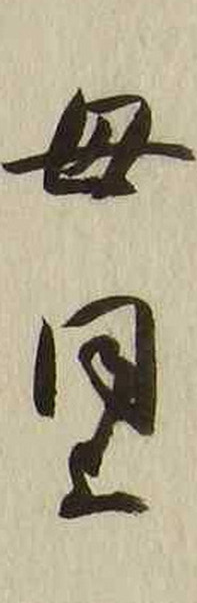母同上
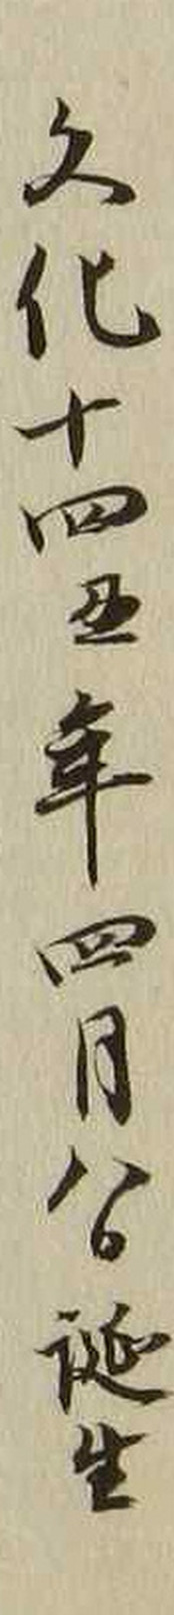女文化十四丑四月八日誕生
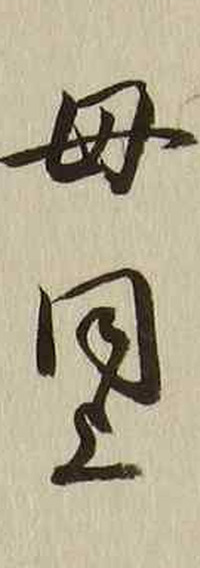母同上
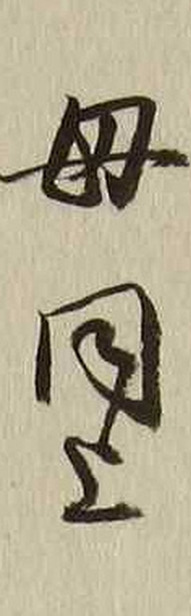母同上
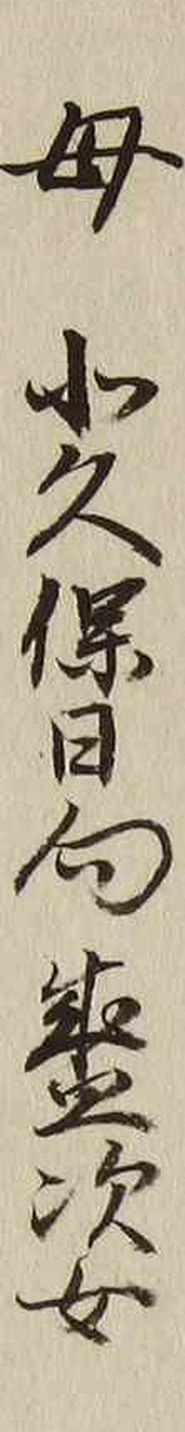母北久保日向盛次女

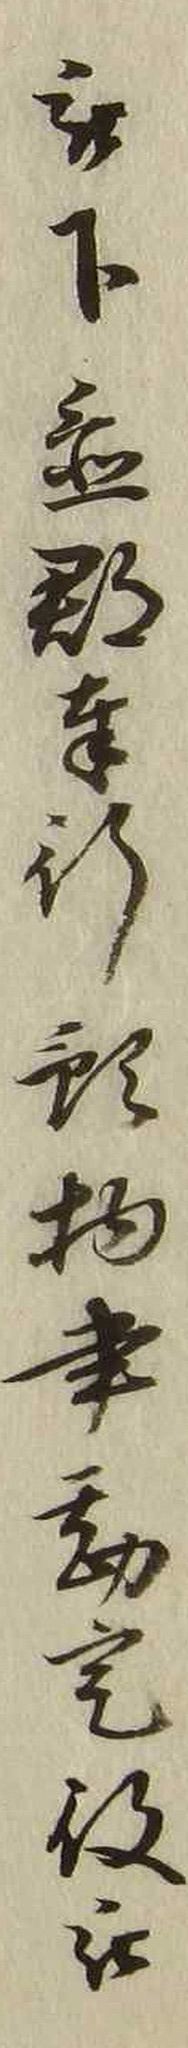被下置郡奉行預物書勘定役被
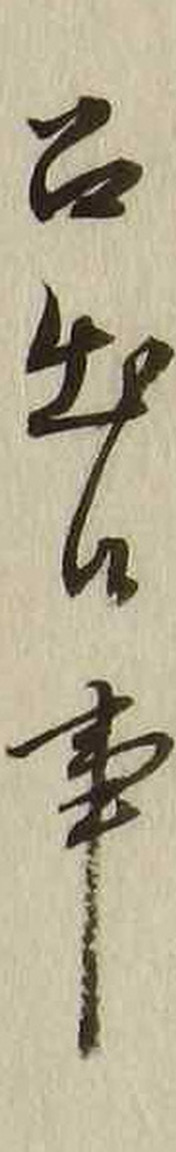召出候事
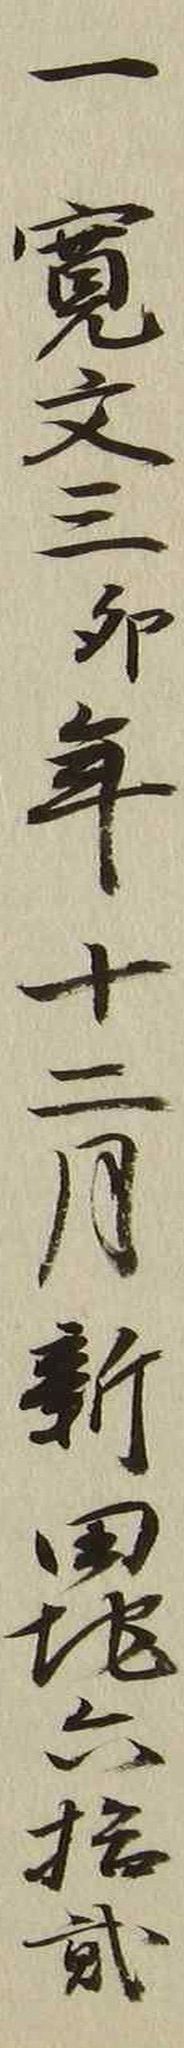一寛文三卯年十二月新田地六拾弐
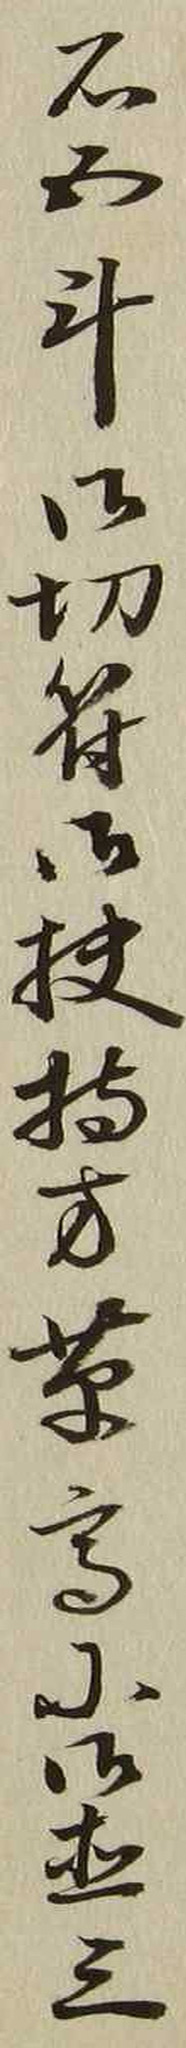石五斗御切符御扶持方草高に御直三
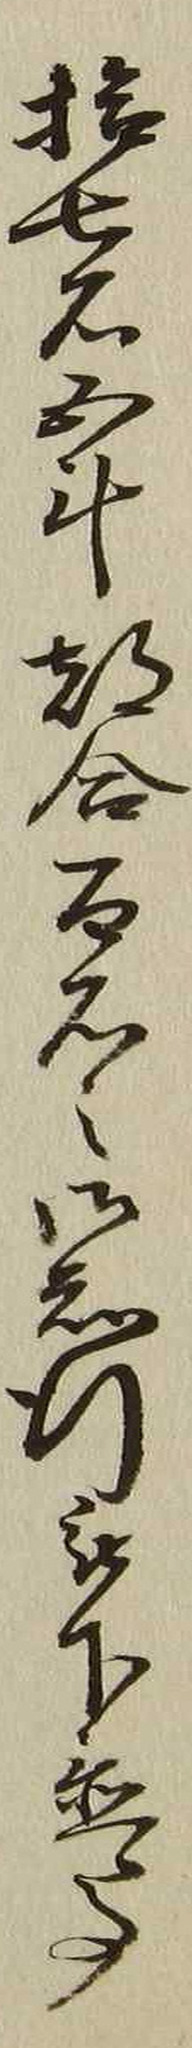拾七石五斗都合百石之御知行被下置候事
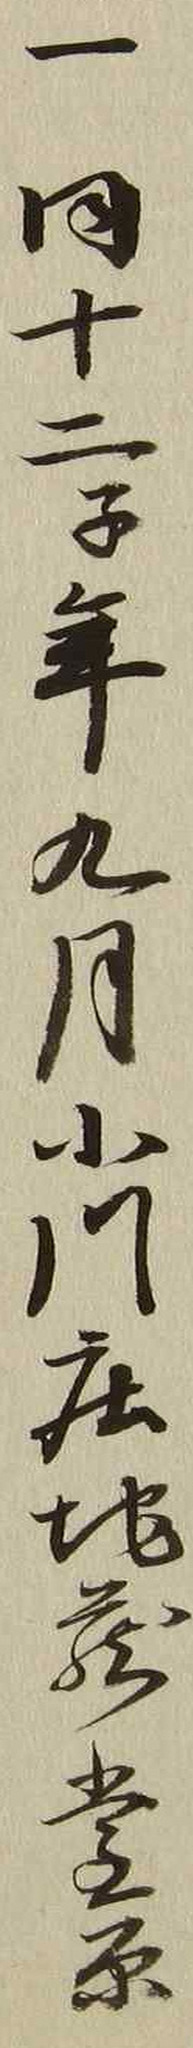一同十二子年九月小川庄地蔵堂原
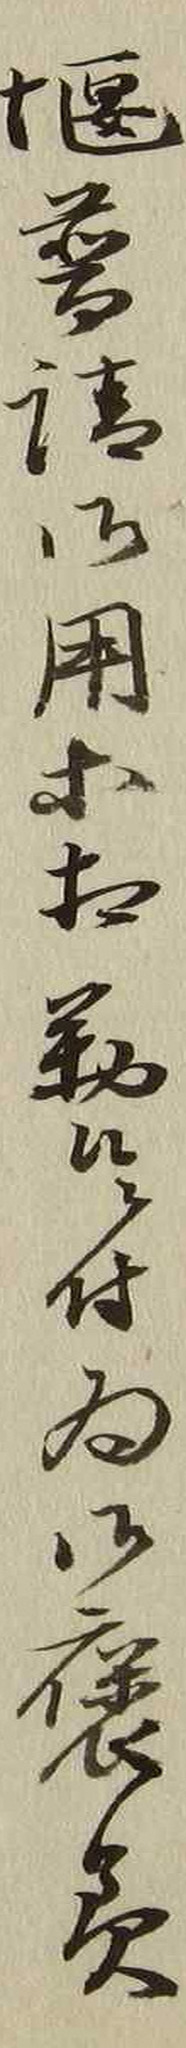堰普請御用等相勤候ニ付為御褒美
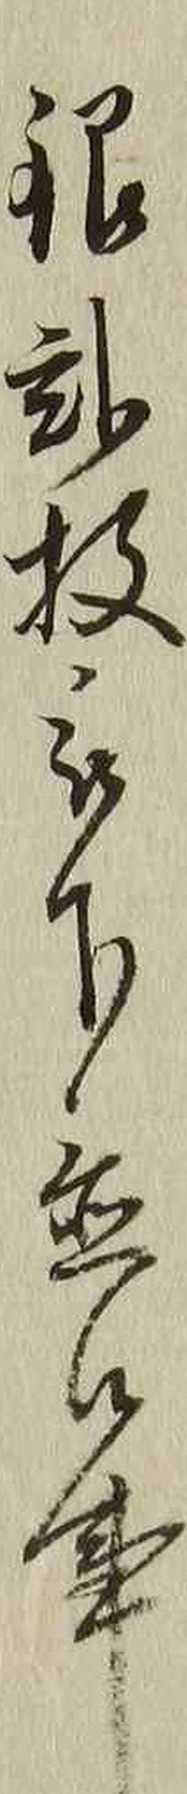銀弐枚被下置候事
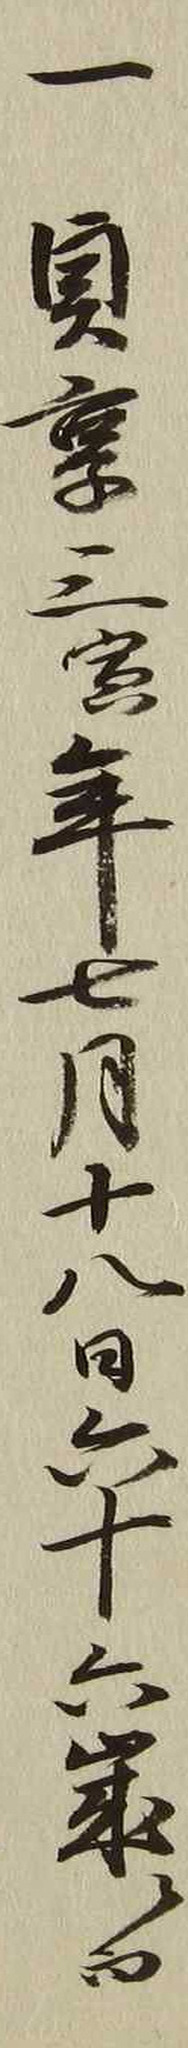一貞享三寅年七月十八日六十六歳ニ而
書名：諸士系譜　巻之61　と之部4
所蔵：会津若松市立会津図書館
